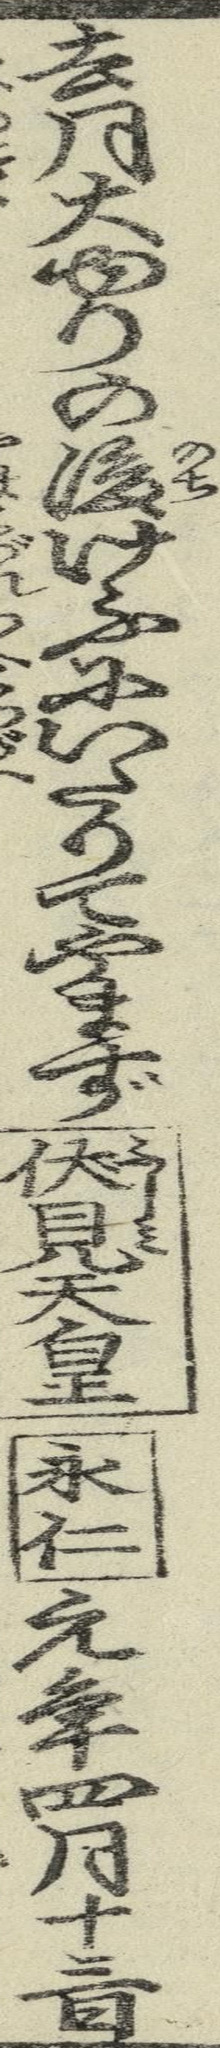去月大ゆりの後けふにいたりてやまず伏見天皇永仁元年四月十三日
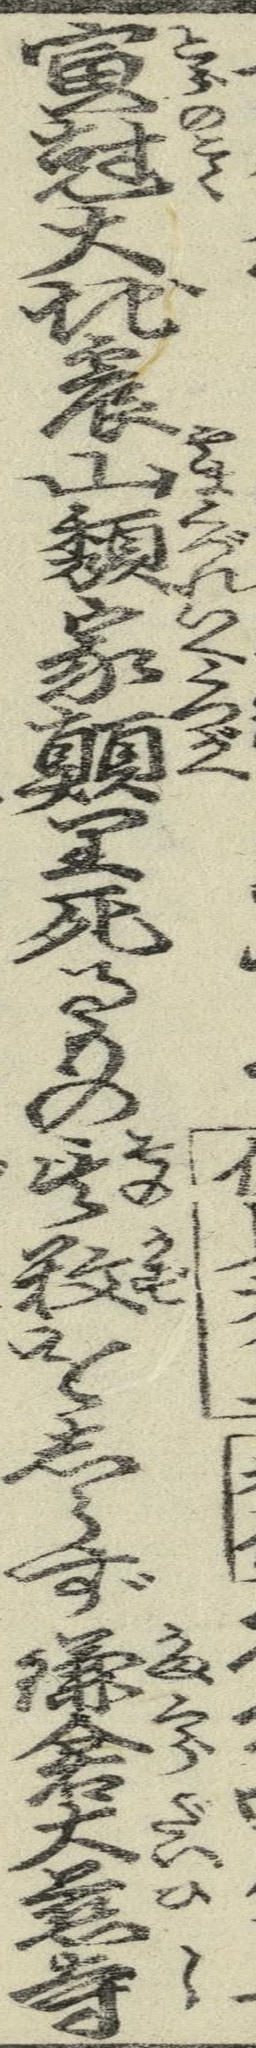寅尅大地震山頽家顛り死るもの其数をしらず鎌倉大悲寺
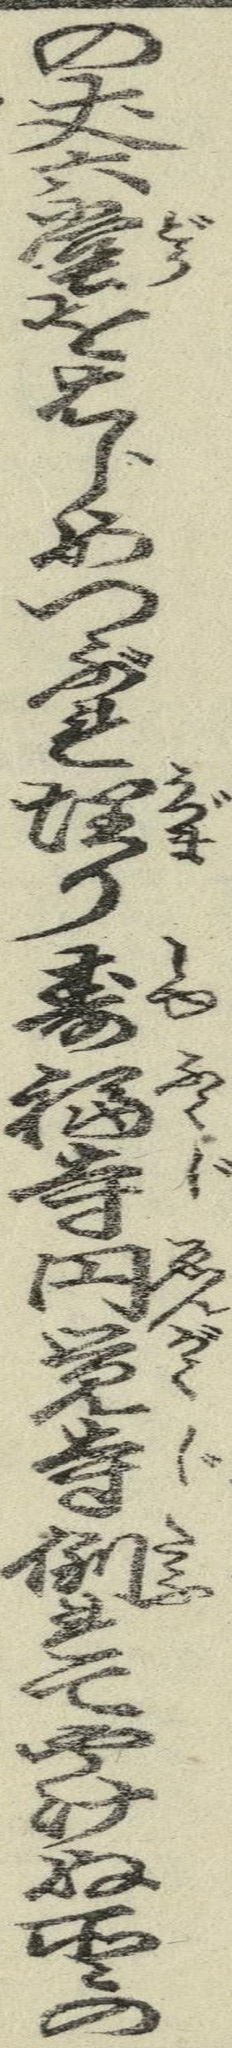の丈六堂をはじめつぶれ埋り寿福寺円覚寺倒れてやけぬ所々の
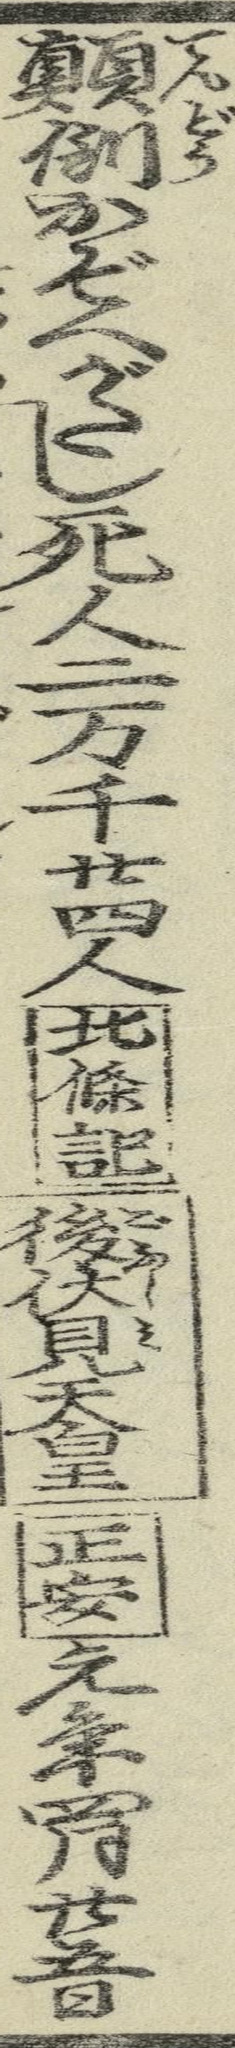顛倒かぞへがたし死人二万千廿四人北條記後伏見天皇正安元年四月廿五日
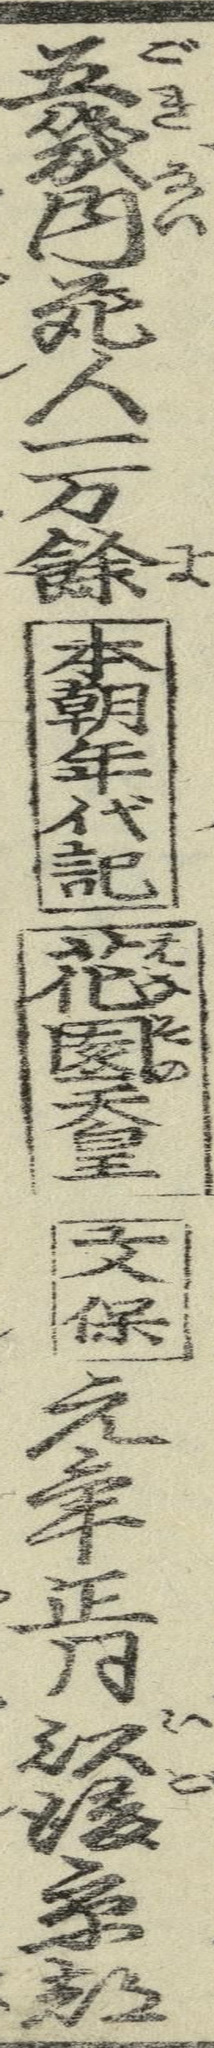五畿内死人一万余本朝年代記花園天皇文保元年正月以後京都
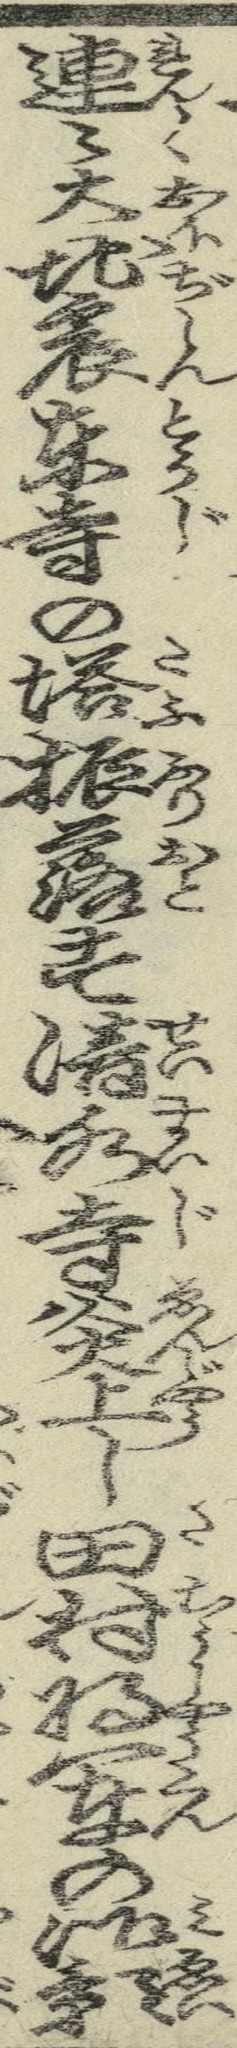連〻大地震東寺の塔振落す清水寺炎上し田村将軍の御影
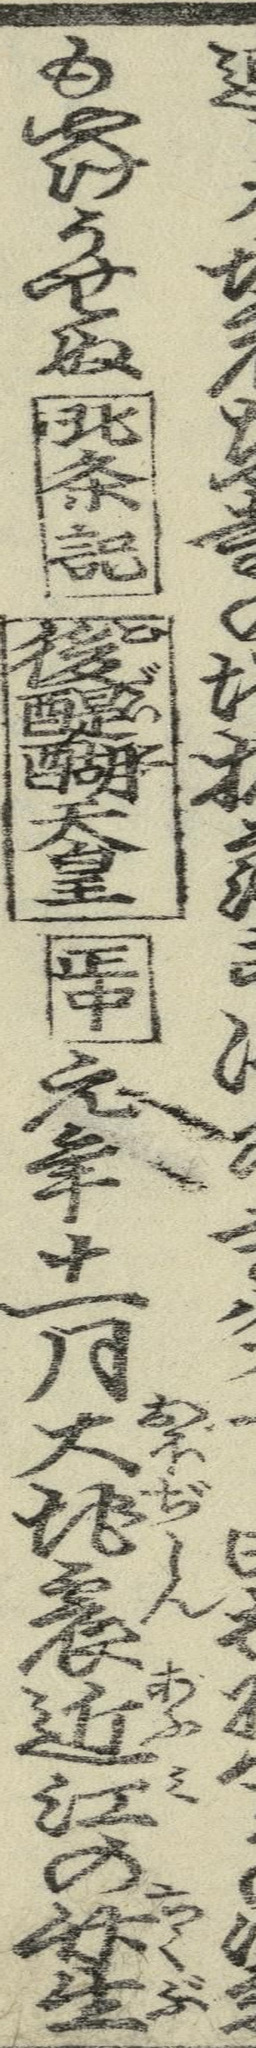もやけうせぬ北条記後醍醐天皇正中元年十一月大地震近江の竹生
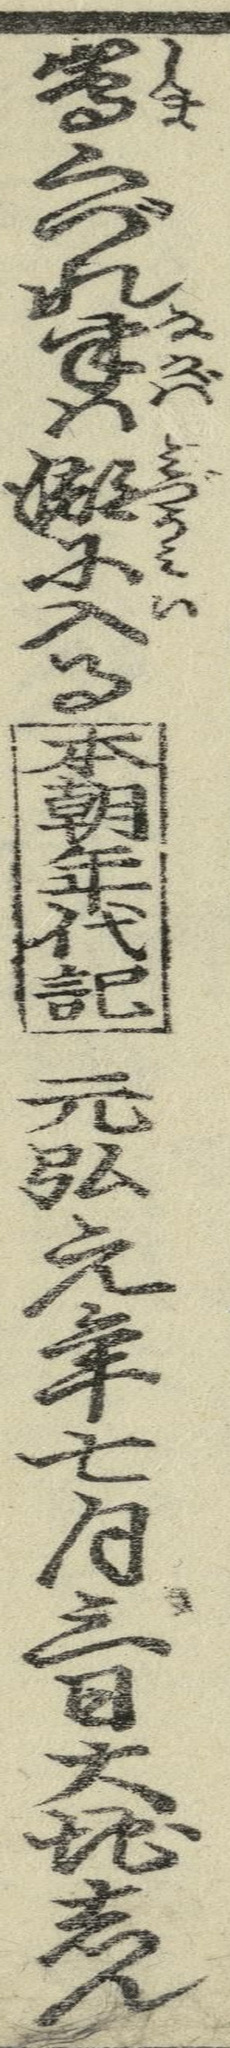島くづれ半は湖に入る本朝年代記元弘元年七月三日大地しん

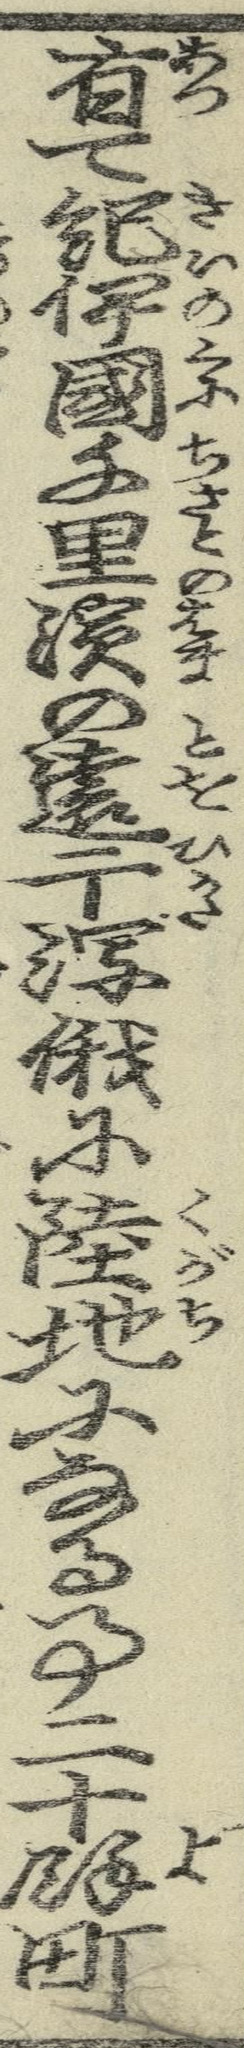有て紀伊国千里浜の遠干潟俄に陸地になる事二十余町
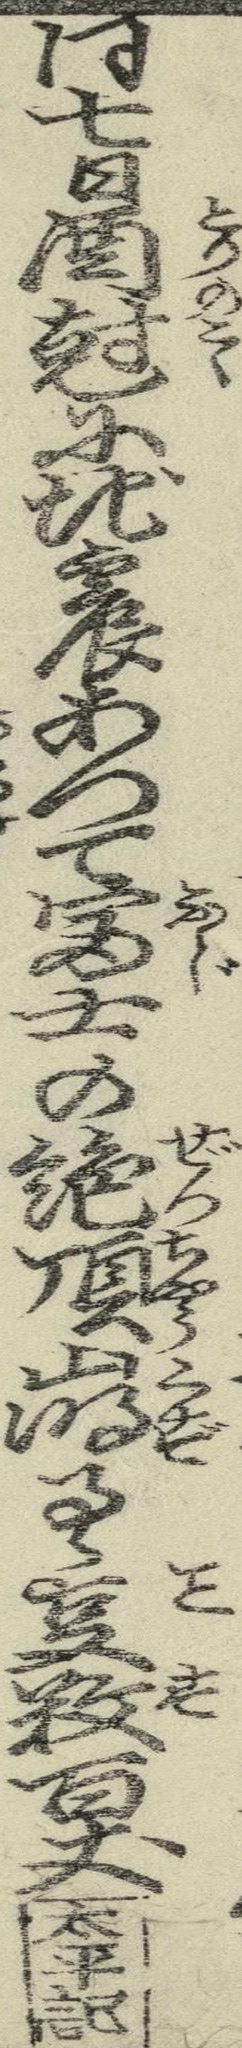同七日酉尅に地震あつて富士の絶頂崩るゝ事数百丈太平記
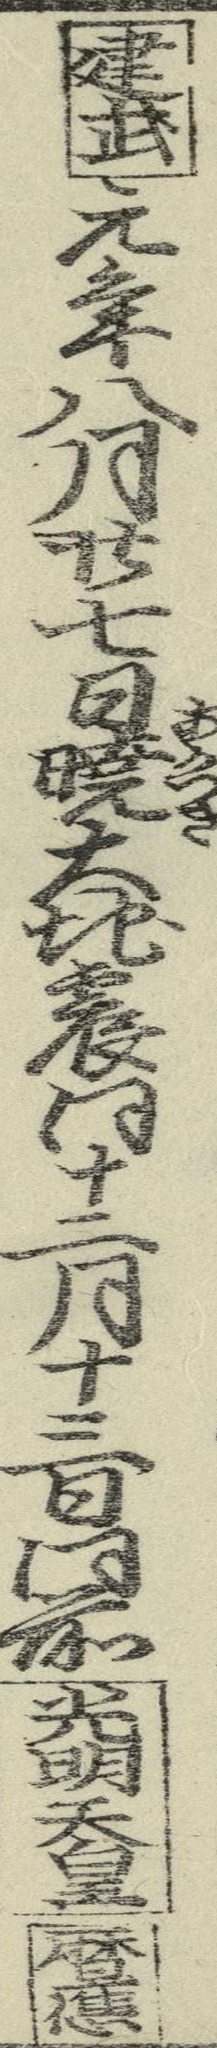建武元年八月廿七日暁大地震同十二月十三日同前光明天皇暦應
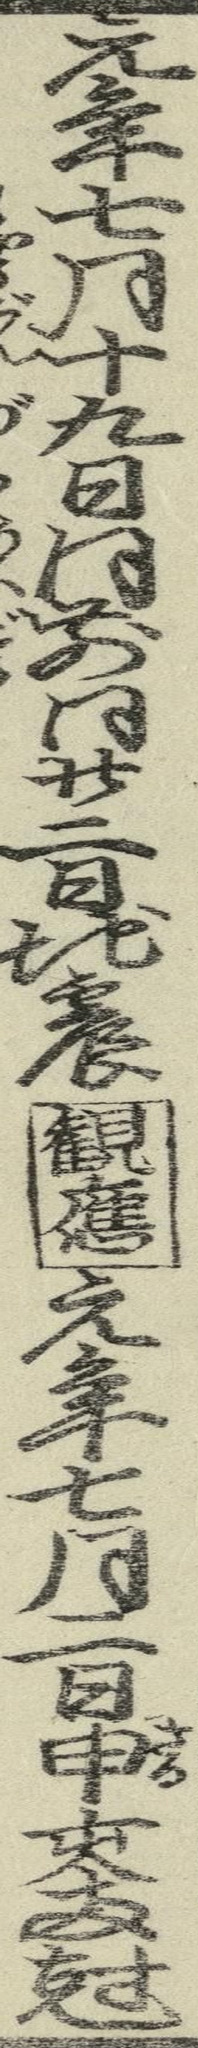元年七月十九日同前同廿二日地震観應元年七月二日申亥両尅
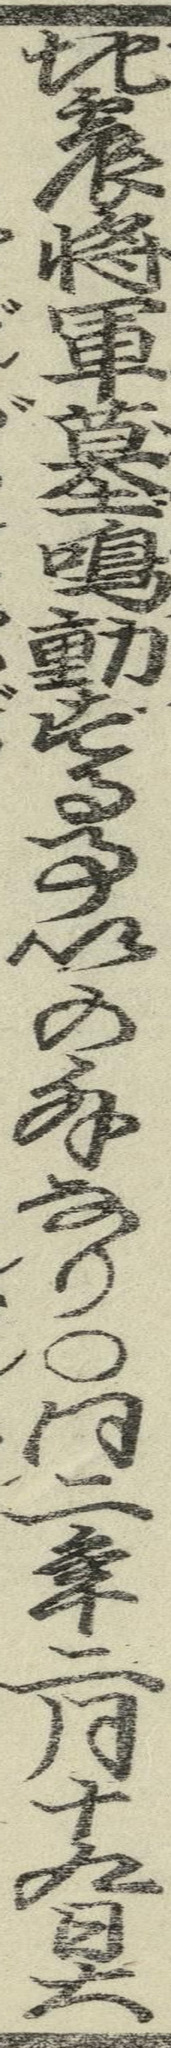地震将軍墓鳴動する事以の外なり○同二年二月十九日大
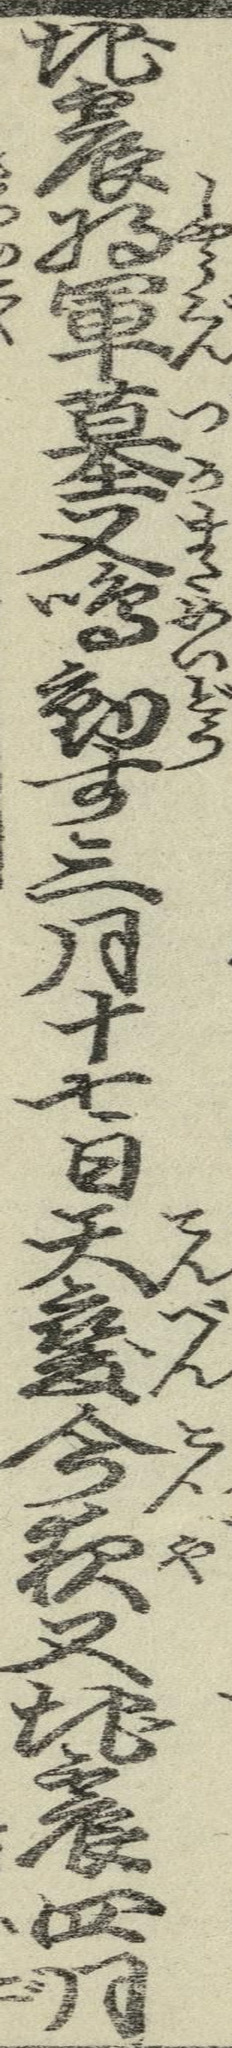地震将軍墓又鳴動す三月十七日天変今夜又地震四月
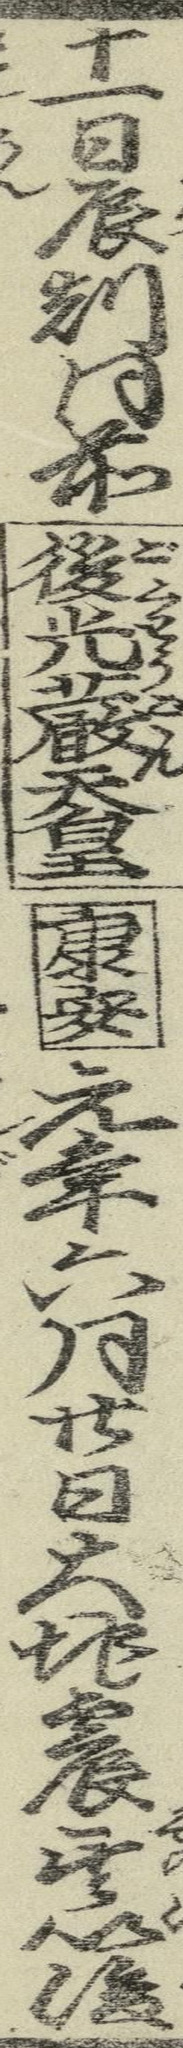十一日辰刻同前後光厳天皇康安元年六月廿日大地震す其以後
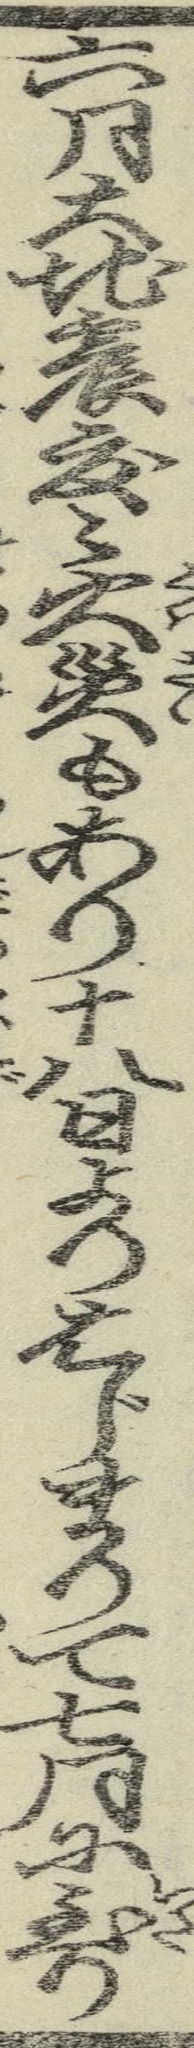六月大地震度々火災もあり十八日よりはじまりて七月に至り
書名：地震年代記
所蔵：東京大学地震研究所図書室 Earthquake Research Institute Library, The University of Tokyo, JAPAN
